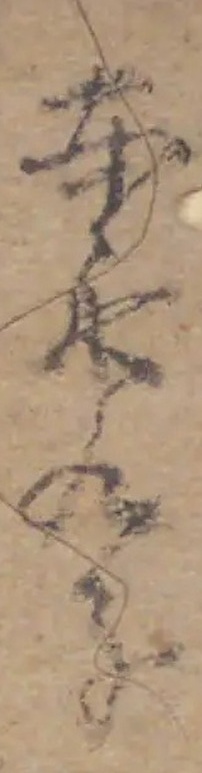安永九年

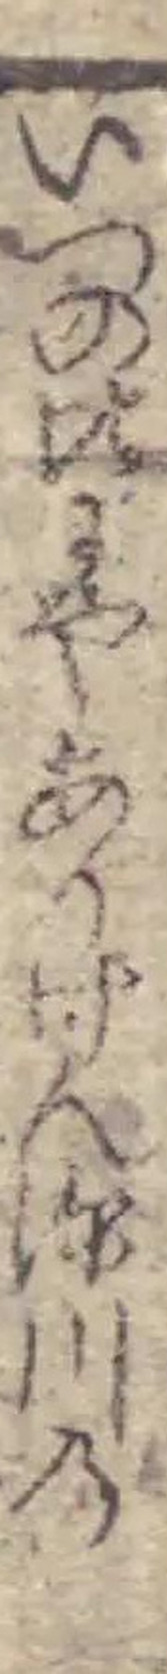いつの頃にやありけん深川の
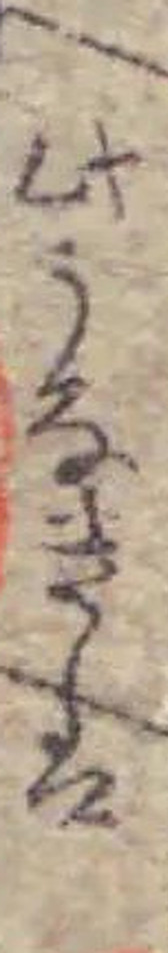此うなきは
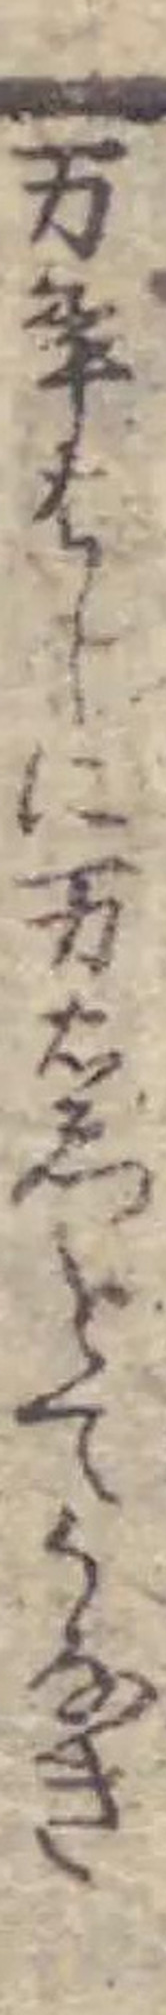万年ばしに万右衛門とてうなき
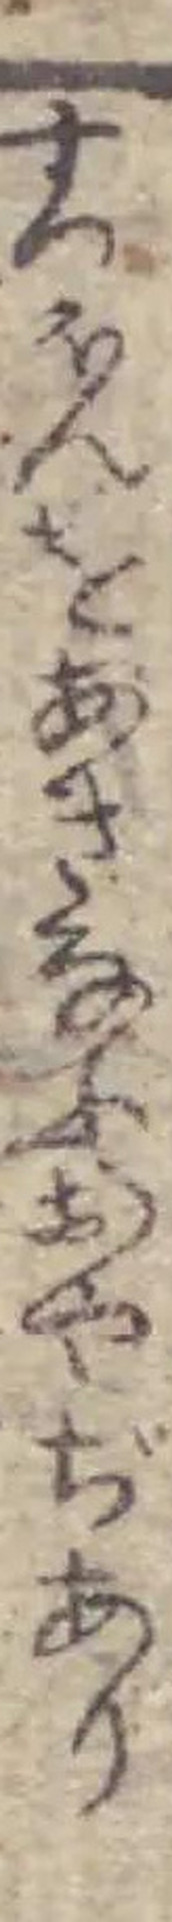すつほんをあきなふおやぢあり
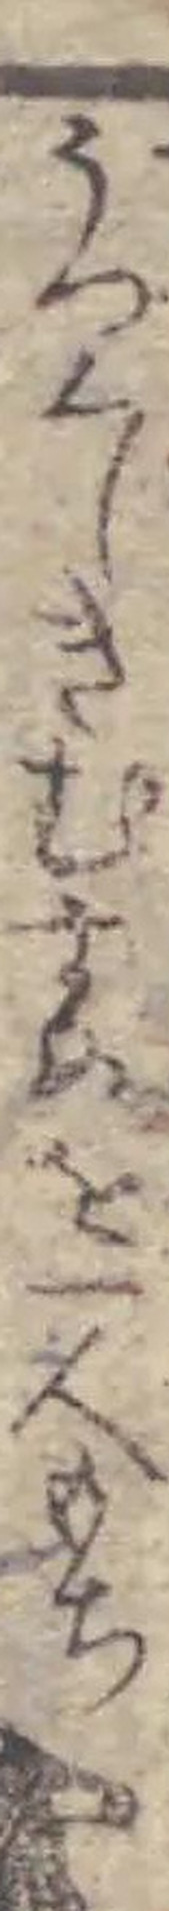うつくしきむすめを一人もち
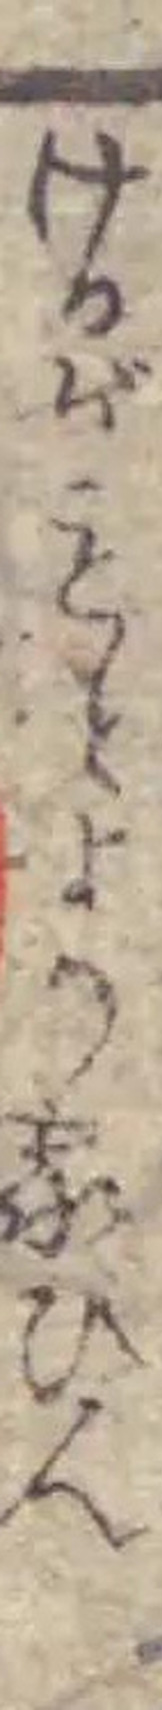けるがもとより家ひん
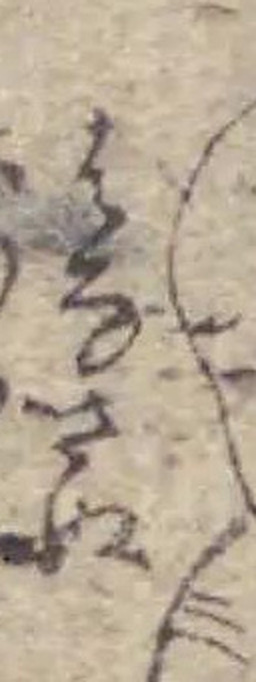はなさぬ
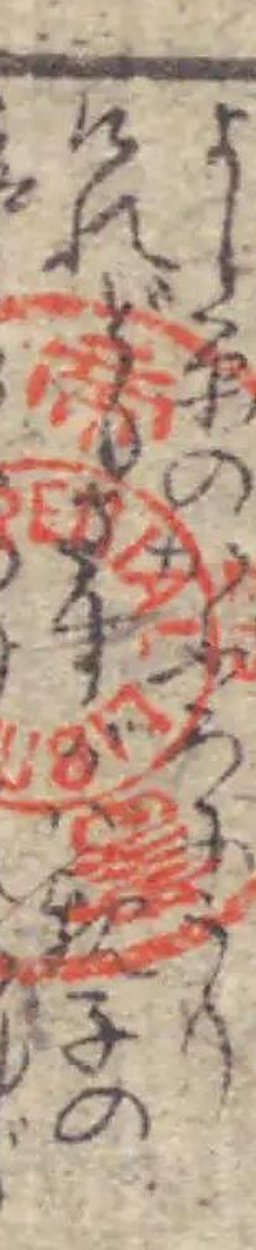けれどもさすがは親子の
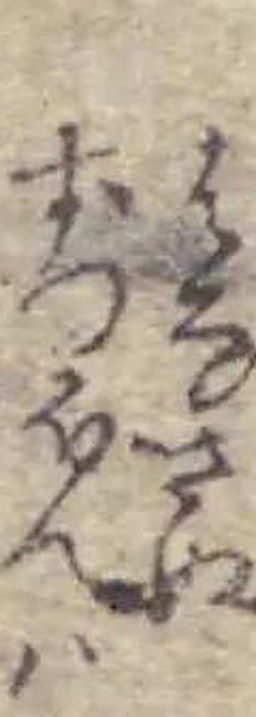すつほんは
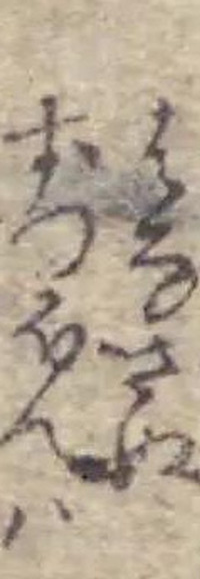すつほんは
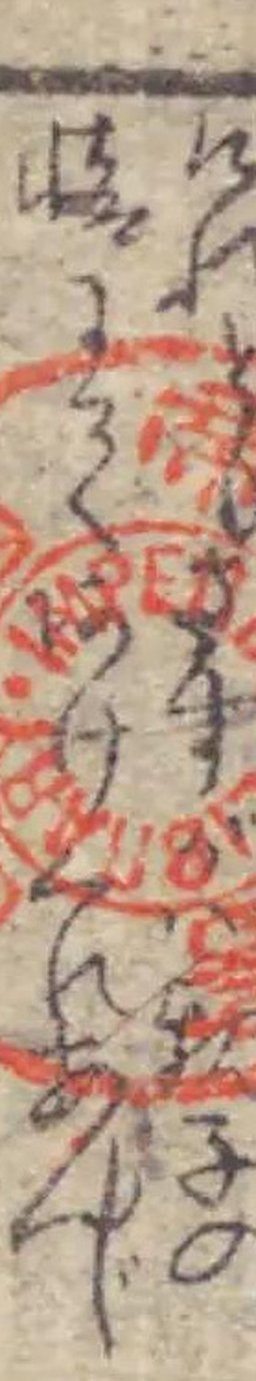情にてあけくれあんじ
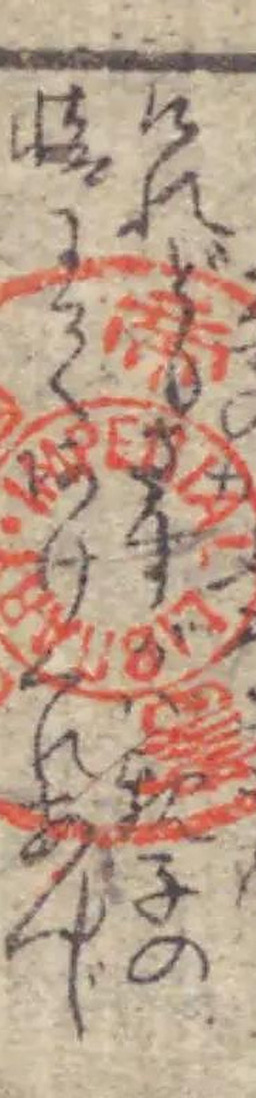情にてあけくれあんじ
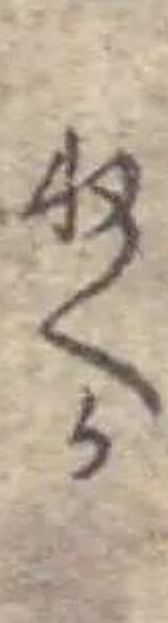ねへか
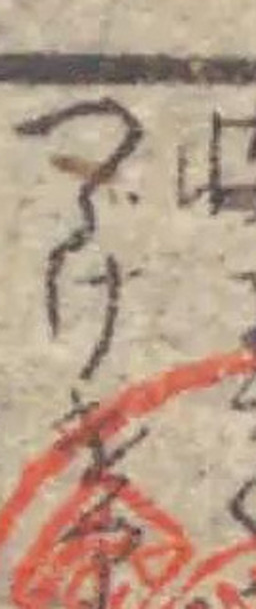つゞけけり
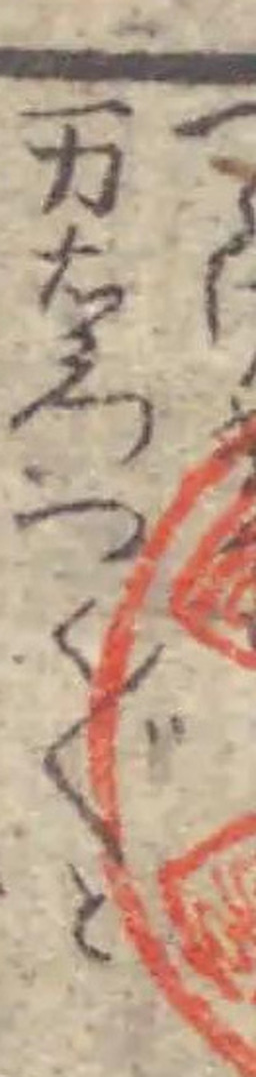万右衛門つく〴〵と
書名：見立蓬莱 : 2巻
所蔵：国立国会図書館 National Diet Library, JAPAN
